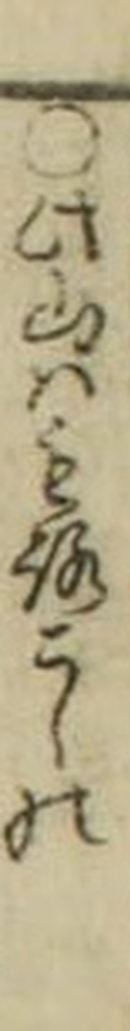◯此山はもろこしの
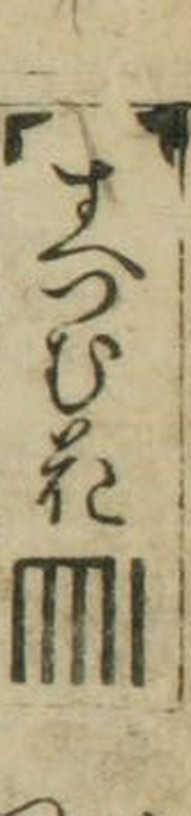すへつむ花
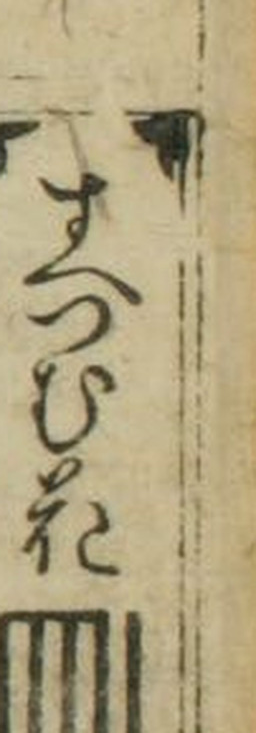すへつむ花
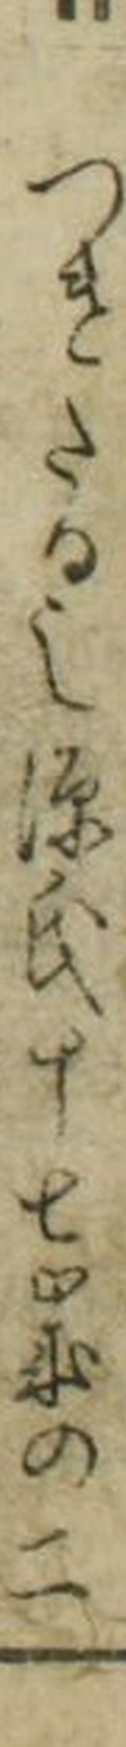つけたる也源氏十七歳の二
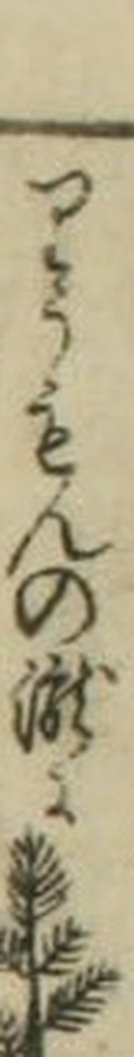りうもんの瀧に
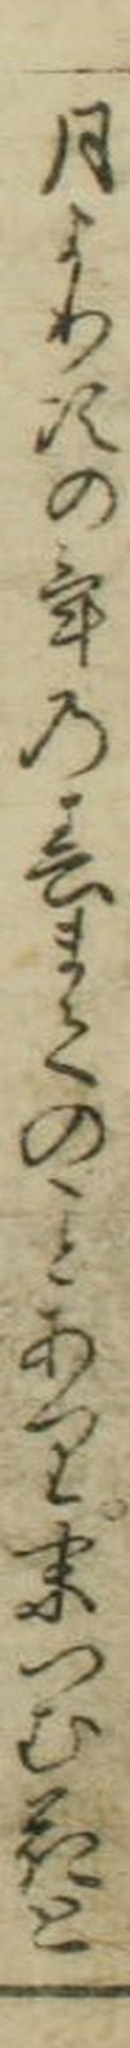月より次の年の春まてのことあり。末つむ花と
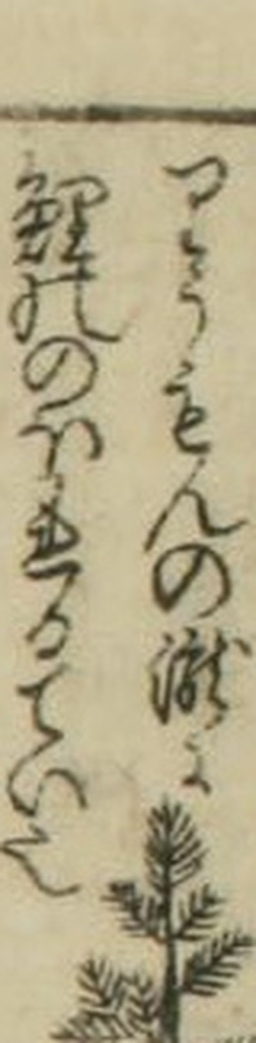鯉のほれるてい也
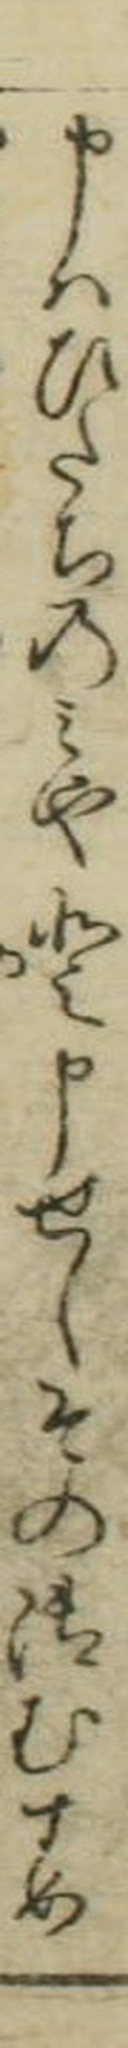申はひたちのミやと申せしその御むすめ
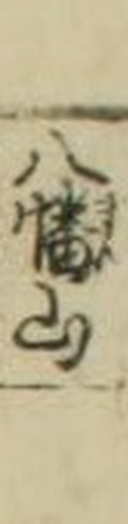八幡山
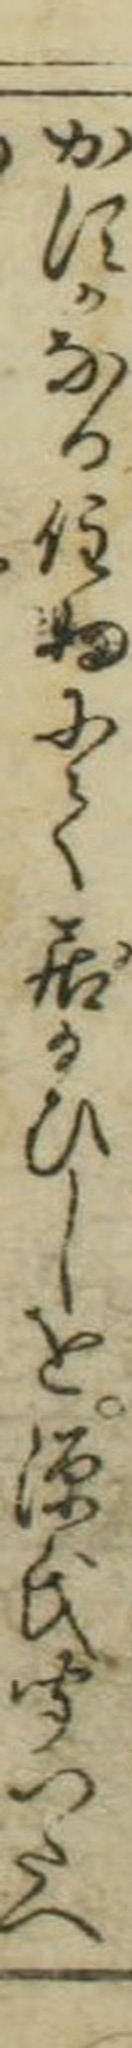かすかなる住ゐにて居給ひしを。源氏聞つたへ
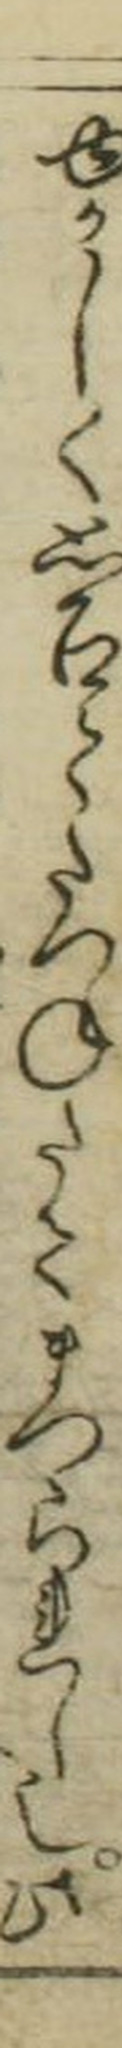ゆかしく思召てたつねたてまつられし也。此
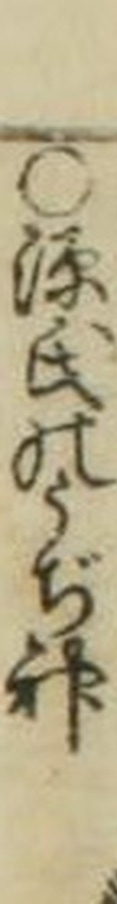○源氏のうぢ神
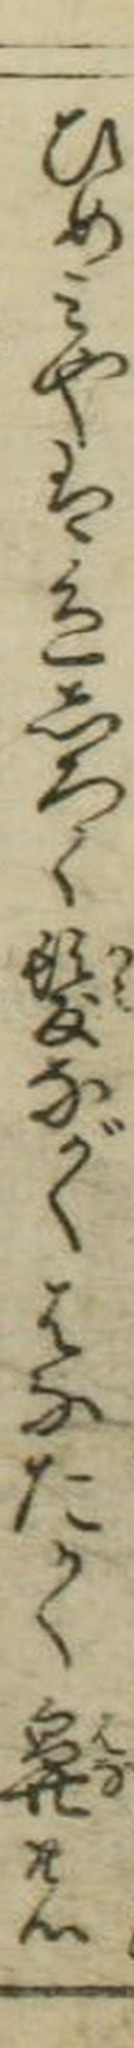ひめミやは色しろく髪長くはなたかく鼻は
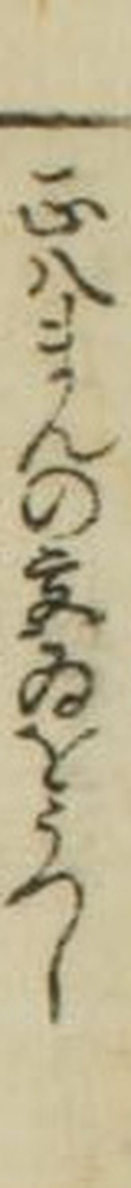正八まんの宮ゐをうつし
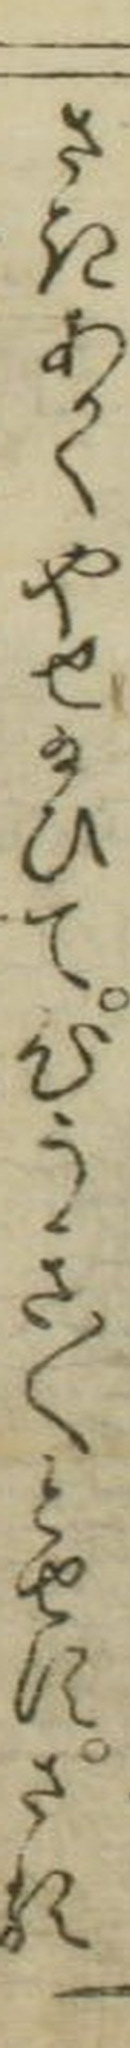さきあかくやせ給ひて。心うき〳〵とせす。さる
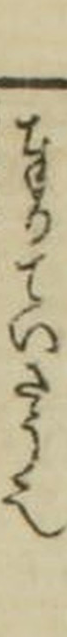奉るていたう也
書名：女源氏教訓鑑
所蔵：東京学芸大学附属図書館
